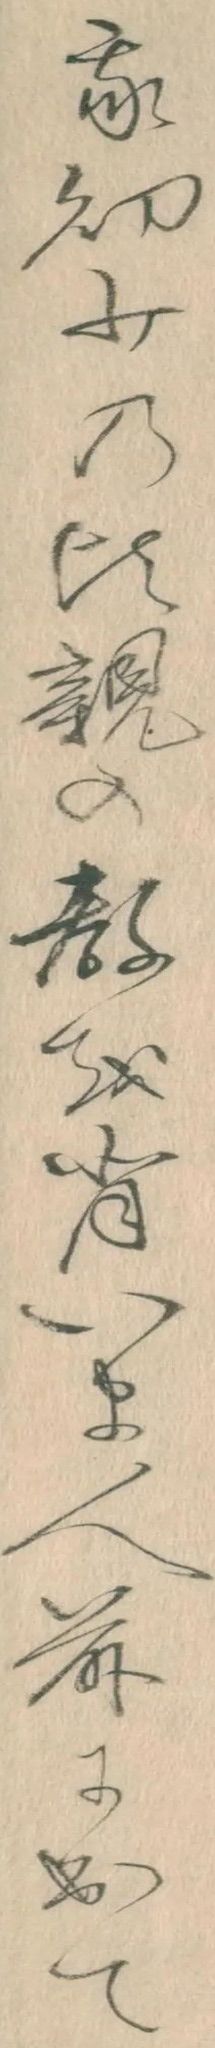我幼少の頃親の教を背いま人前に出て

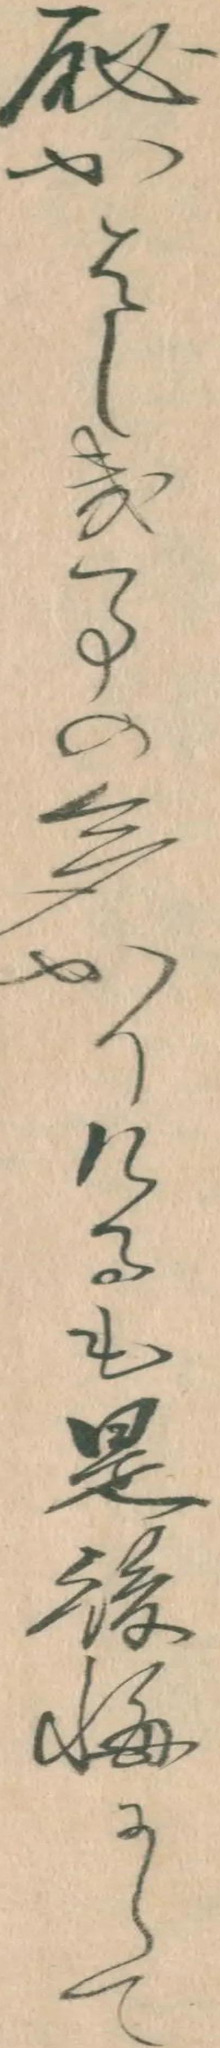恥かはしき事の多かりけるも是後悔にして
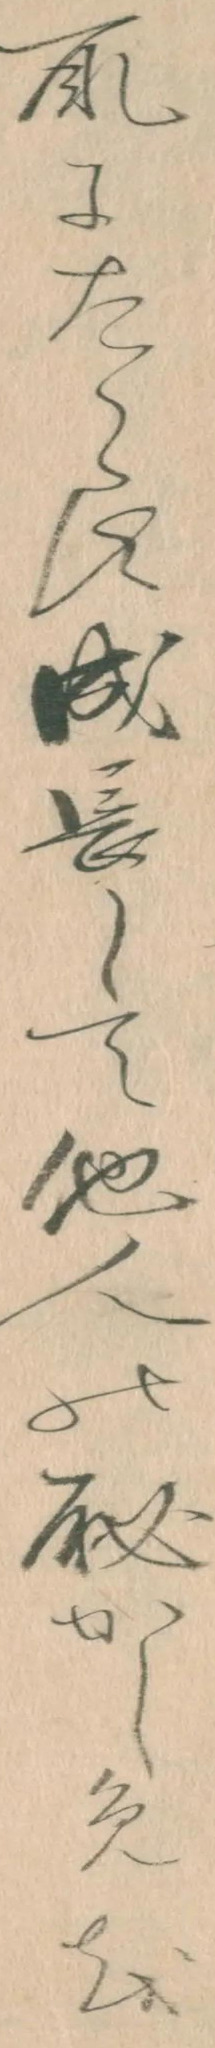取にたらす成長して他人の恥かしめを
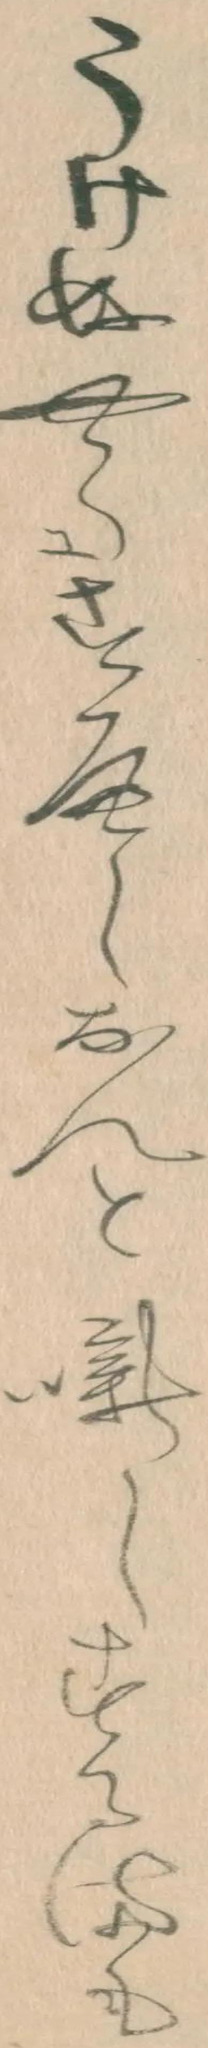うけぬやうにすへしなんと噺しするまも
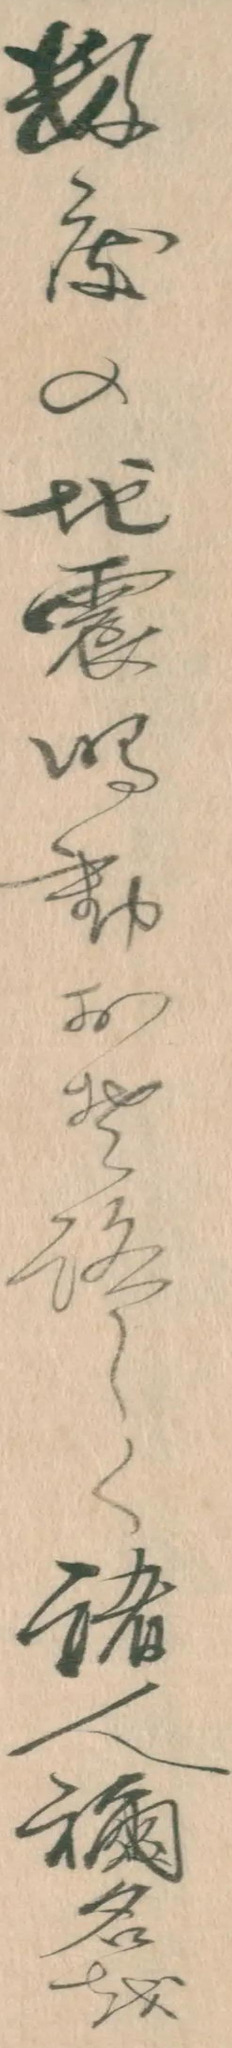数度の地震鳴動おそろしく諸人称名を
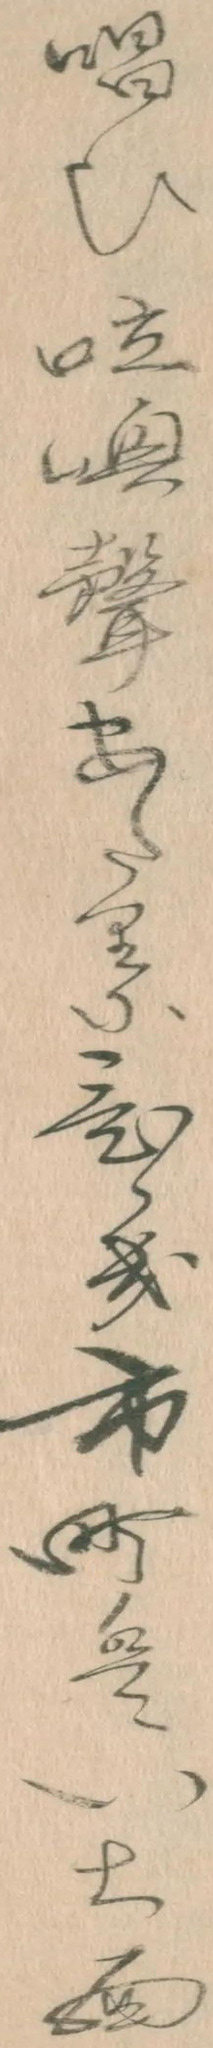唱ひ喚声あたりにひゝき市町はいち面
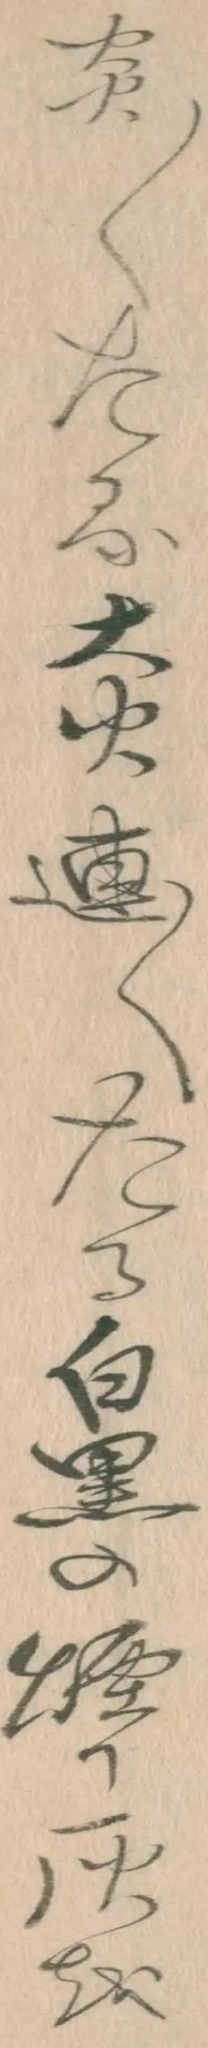炎〳〵たる大火連〳〵たる白黒の煙か灰を
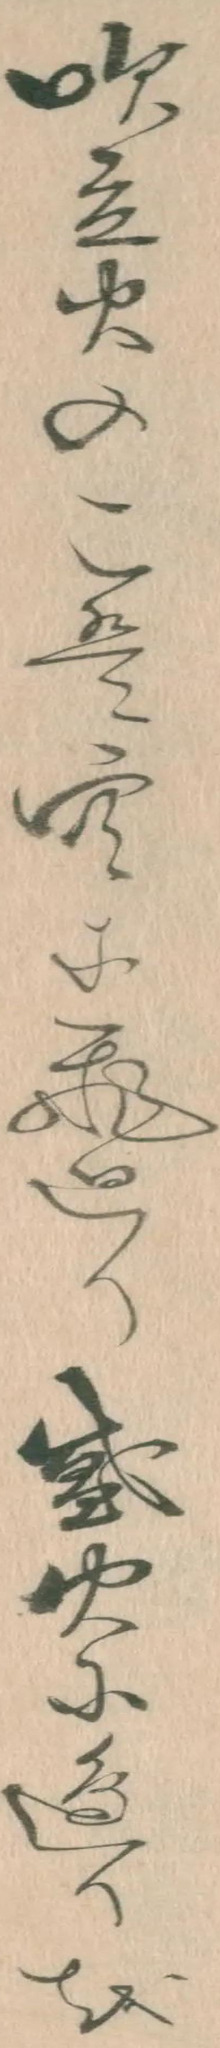吹立火のこは空に飛廻り盛火に辺りを
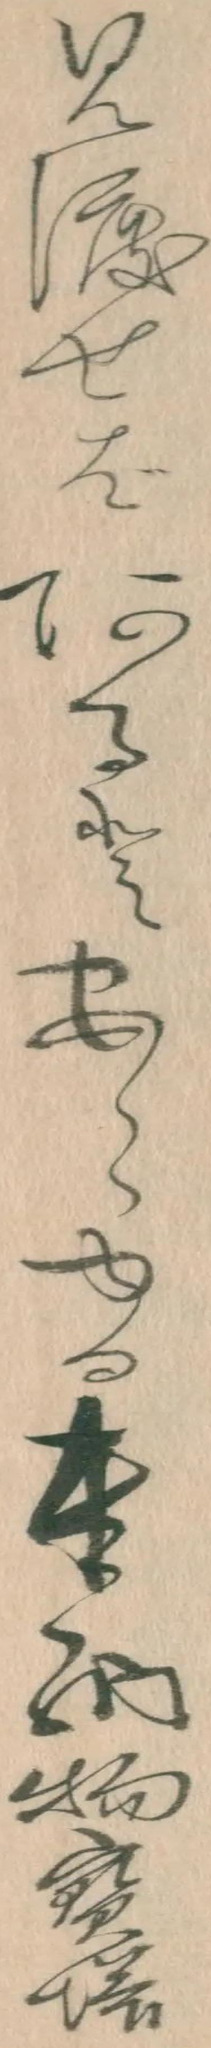見渡せばあるとあらゆる奉納物宝塔
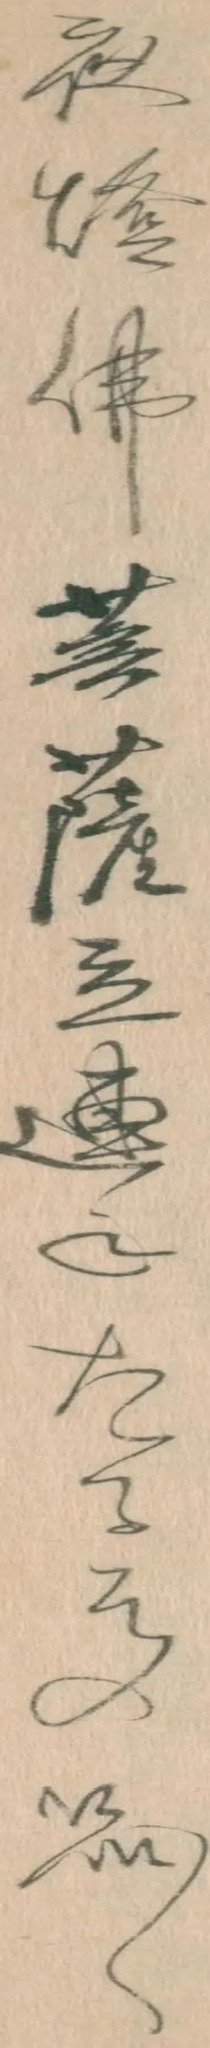夜燈仏菩薩立連ねたるその筋〳〵
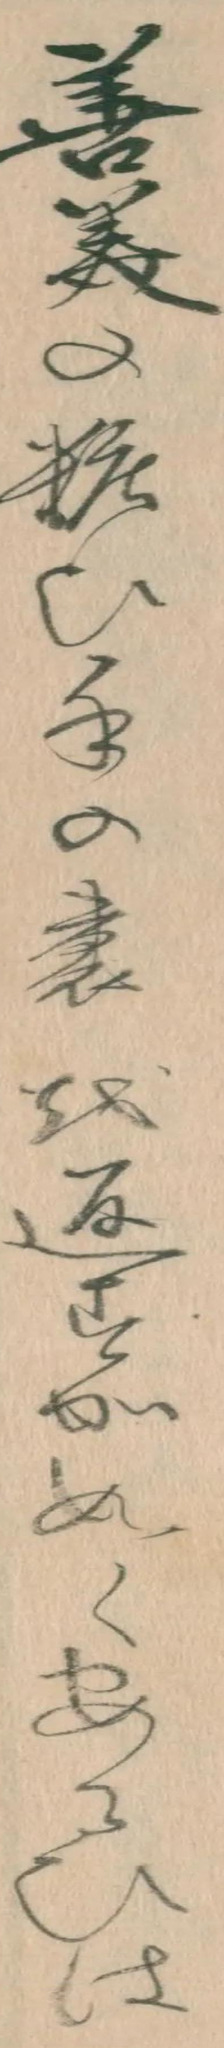善美の粧ひ手の裏を返すが如くあるひは
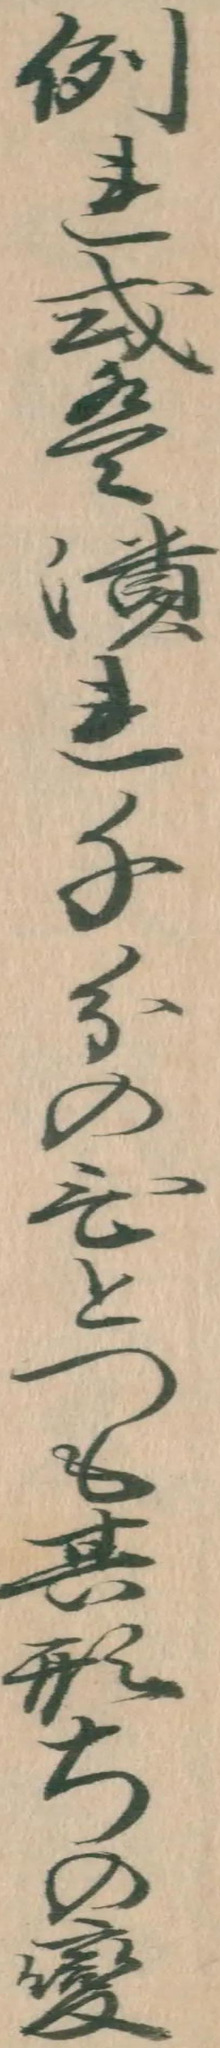倒れ或は潰れ千分のひとつも其形ちの変
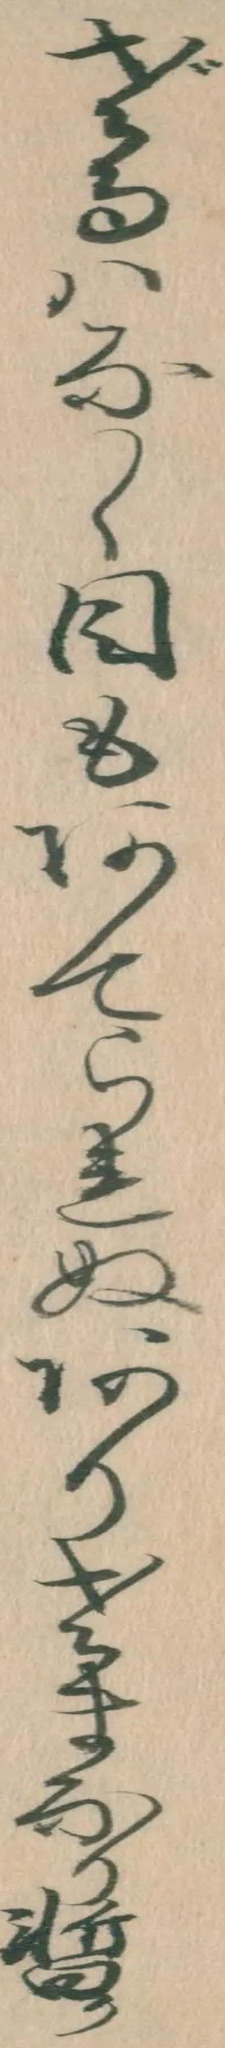ざるはなく目もあてられぬありさまなり暫ク
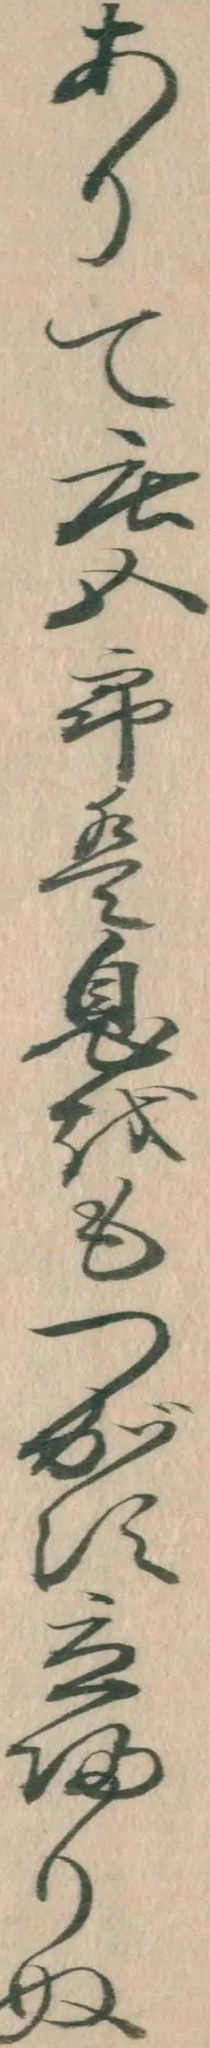ありて庄五郎は息をもつがす立帰りぬ
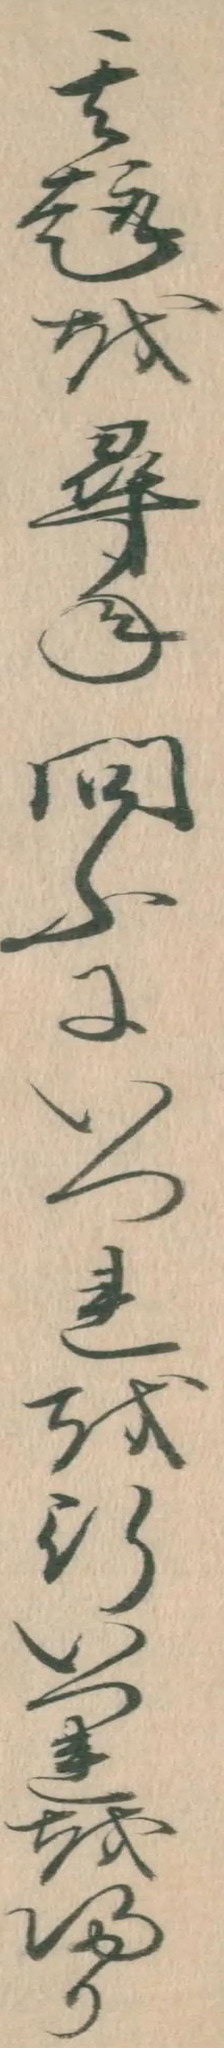其趣を尋ね問ふにいつれを行いつれを帰り
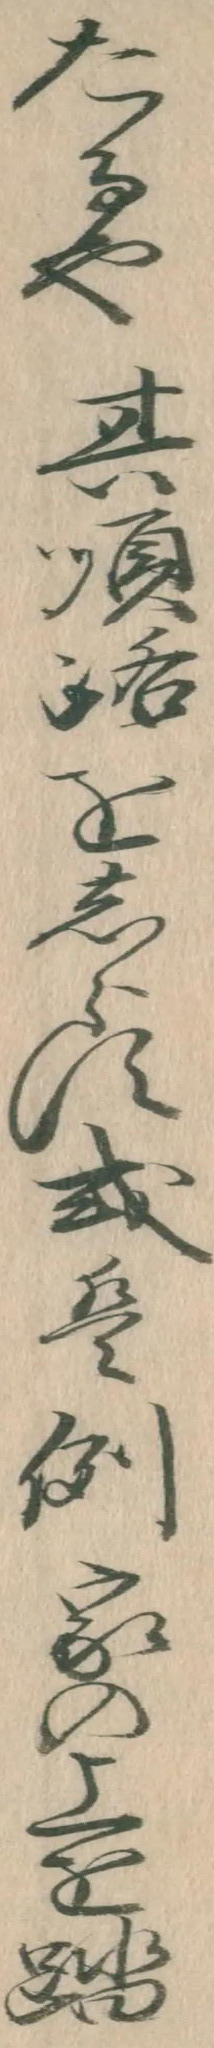たるや其順路をしらす或は倒家の上を踏
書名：俗語之種. [3]
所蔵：国立国会図書館 National Diet Library, JAPAN
